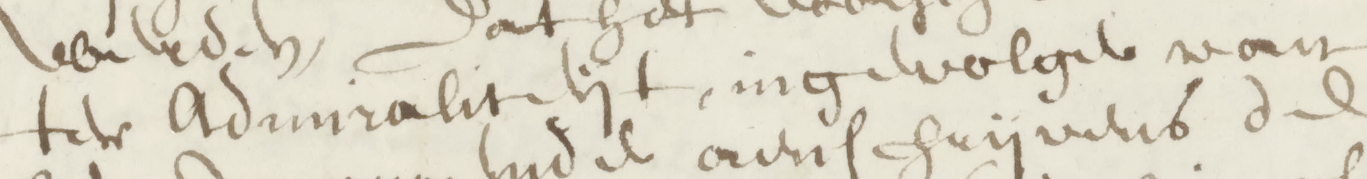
ter Admiraliteijt, ingevolge van
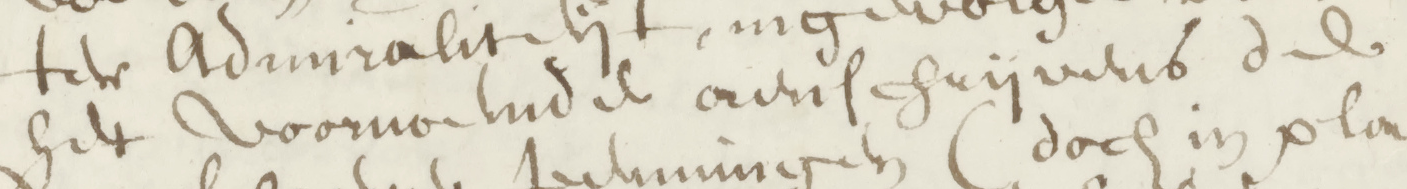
het voornoemde aenschrijvens de
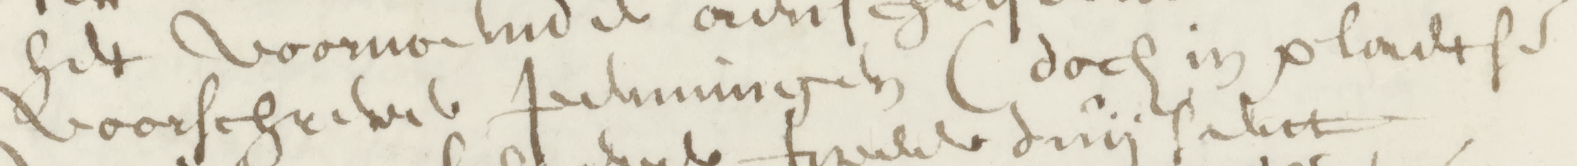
voorschreve penningen (doch in plaetse
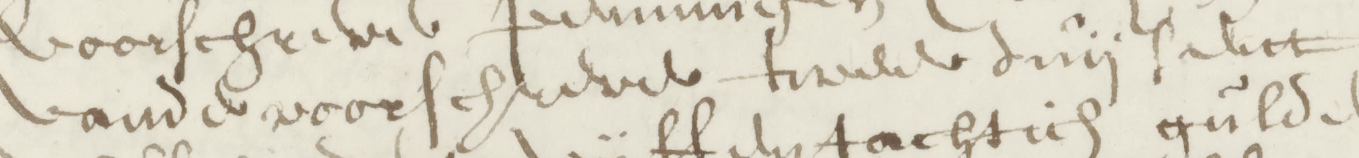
vande voorschreve twee duijsent
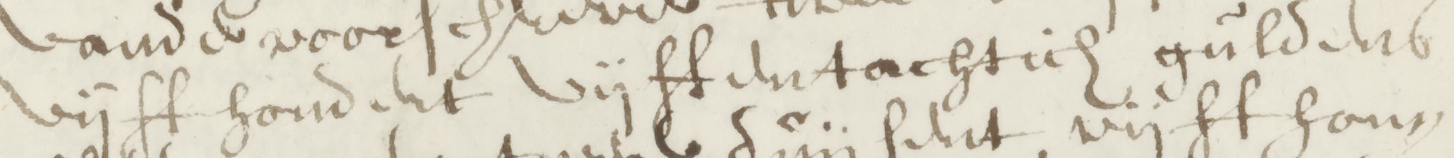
vijff hondert vijffentachtich guldens
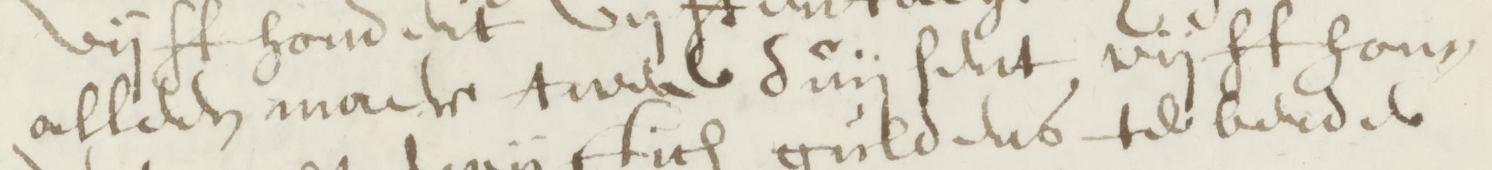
alleen maer twee duijsent vijffhon„
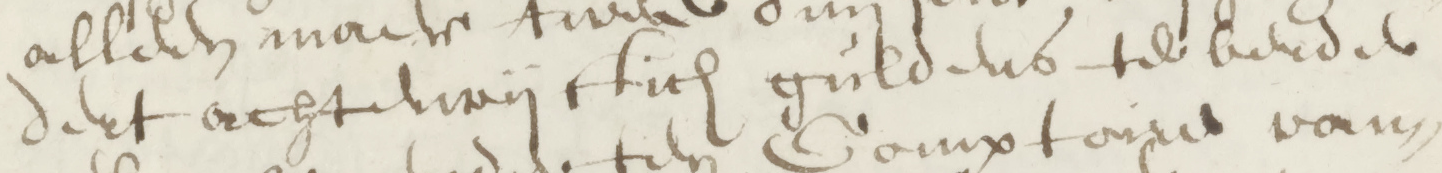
dert achtenvijftich guldens te berde
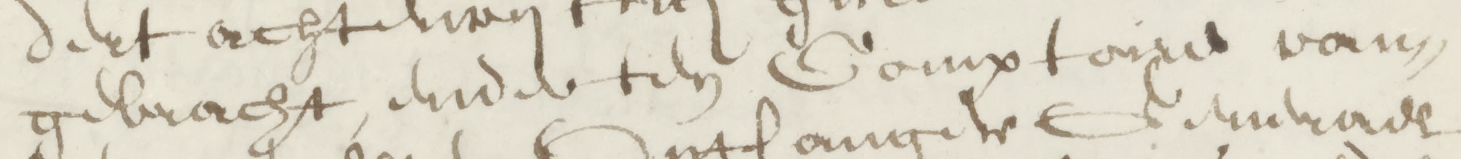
gebracht ende ten Comptoire van,,
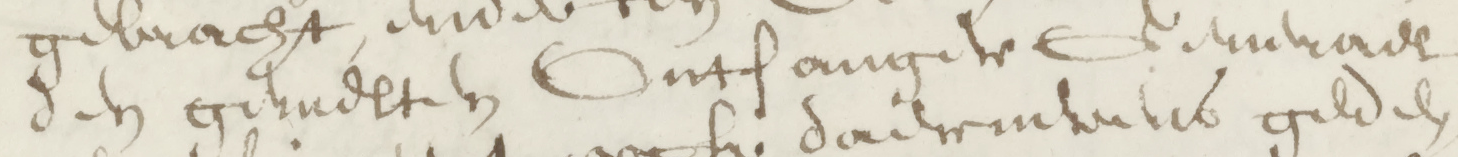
den gemelten Ontfanger Generael
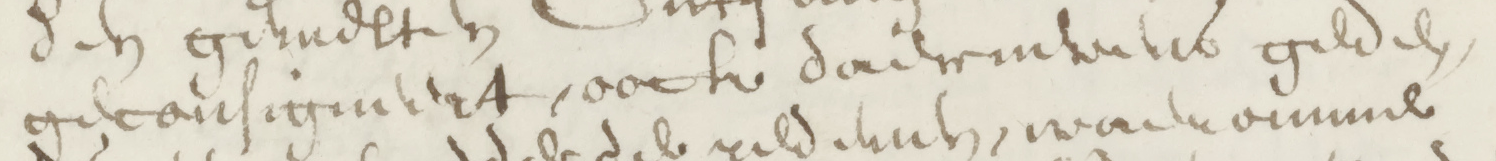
geconsigneert, oock daernevens geden,,
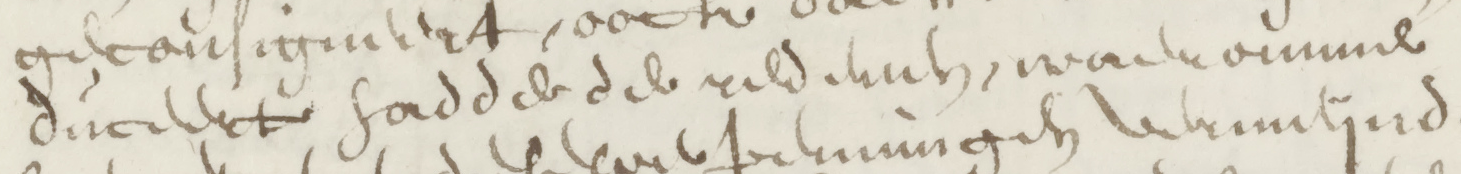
diceert hadde de redenen, waeromme
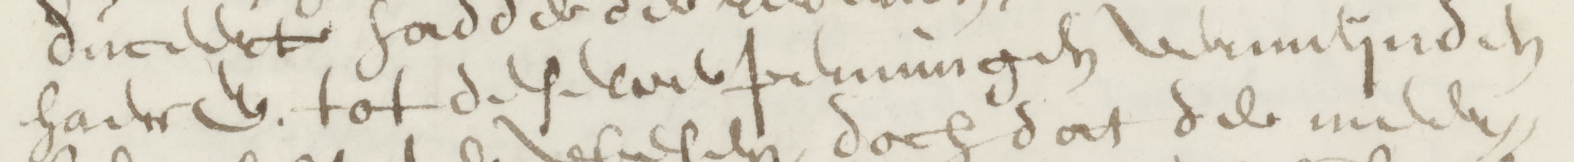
haer E. tot deselve penningen vermeijnden
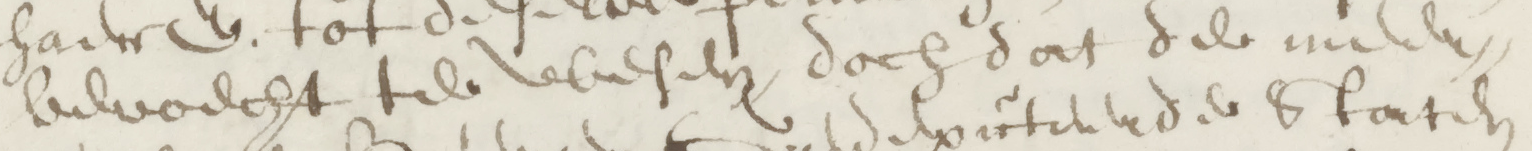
bevoecht te wesen, doch dat de meer„
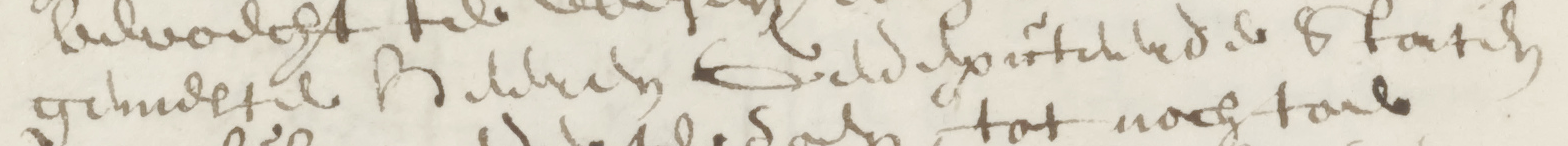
gemelte Heeren Gedeputeerde Staten
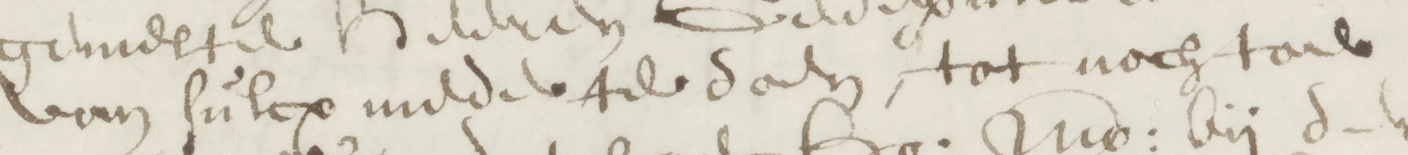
van sulcx mede te doen, tot noch toe
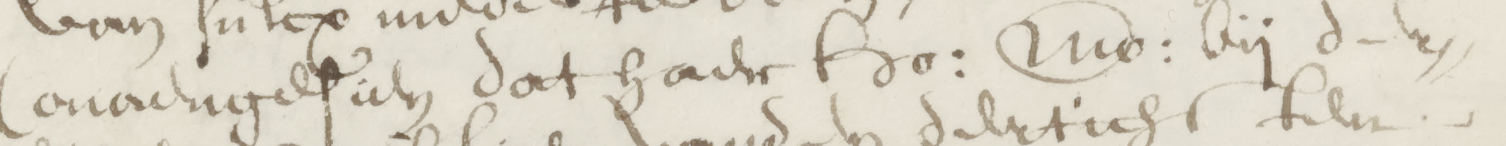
(onaengesien dat haer Ho:Mo: bij der„
